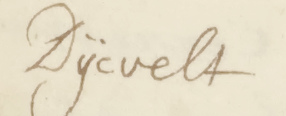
Dijcvelt
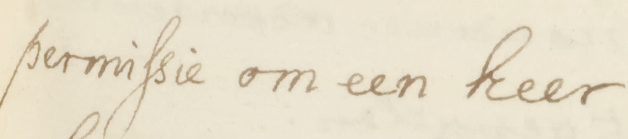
permissie om een keer
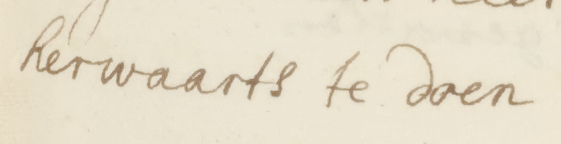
herwaarts te doen
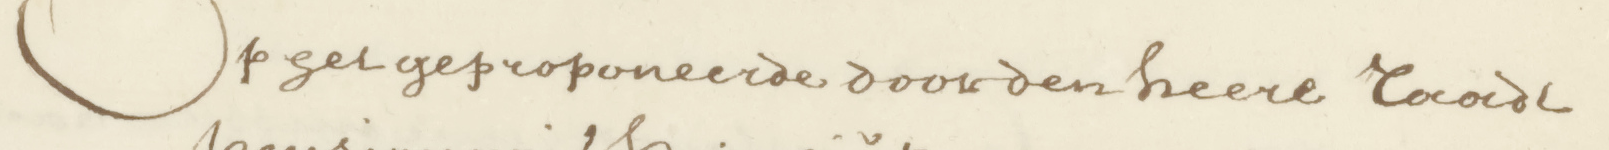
Op het geproponeerde door den heere Raadt
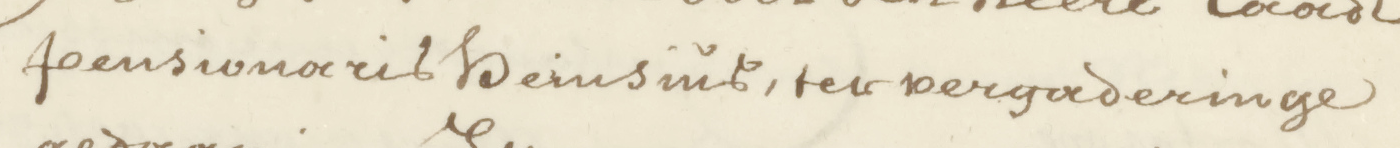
pensionaris Heinsius, ter vergaderinge
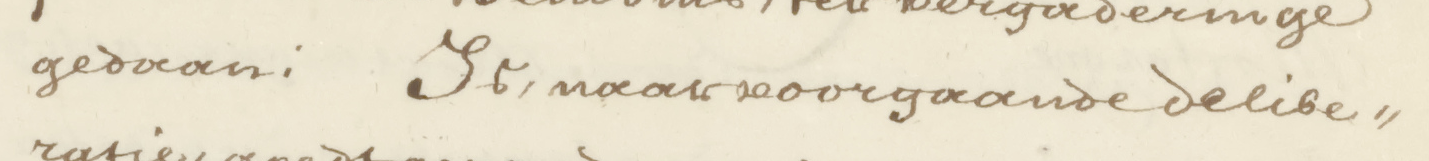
gedaan: Is, naar voorgaande delibe„
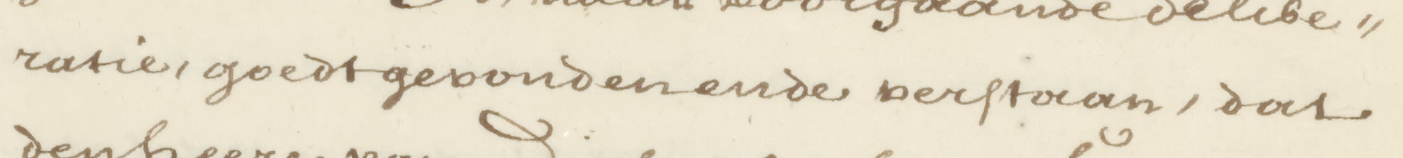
ratie, goedtgevonden ende verstaan, dat
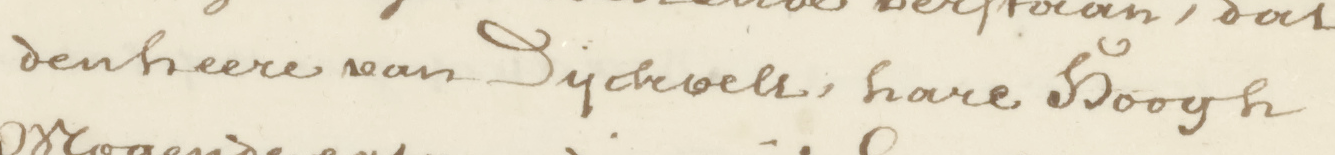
den heere van Dijckvelt, hare Hoogh
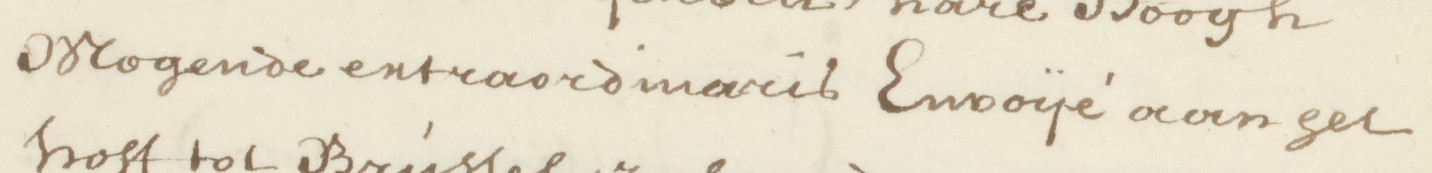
Mogende extraordinaris Envoijé aan het
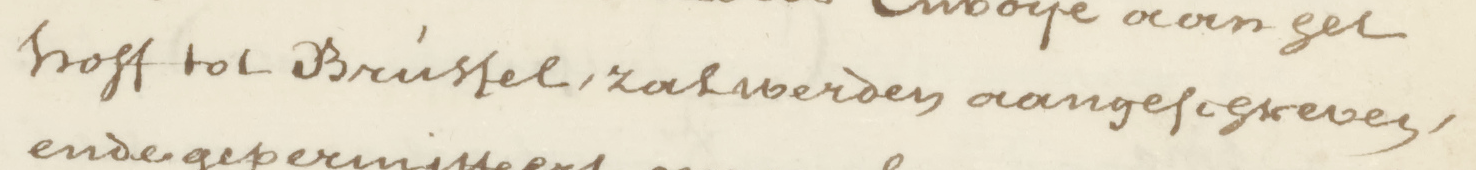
hoff tot Brussel, zal werden aangeschreven,
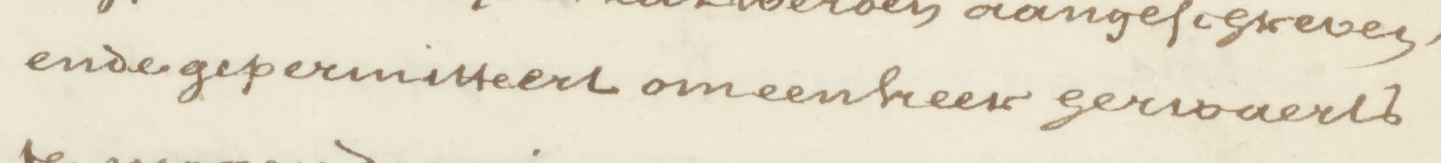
ende gepermitteert om een keer herwaerts
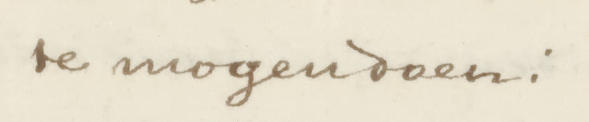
te mogen doen:
